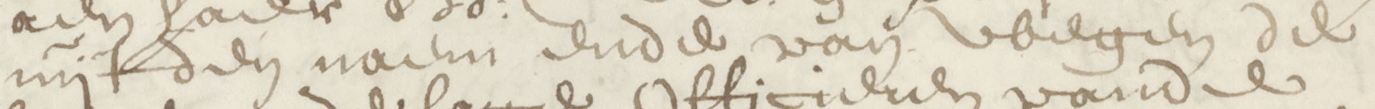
uijt den naem ende van wegen de
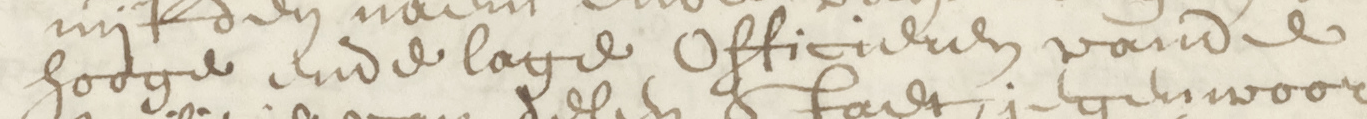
hooge ende lage Officieren vande
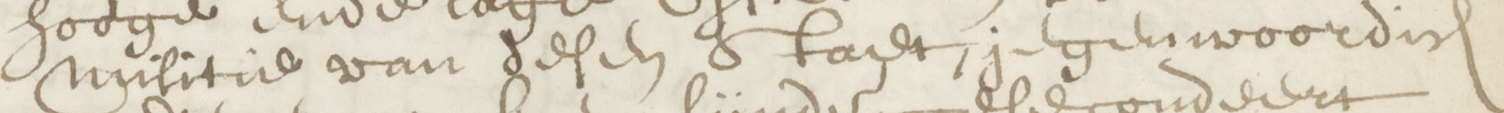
militie van desen Staet, jegenwoordich
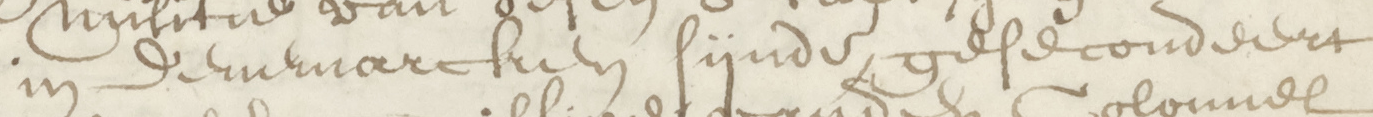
in Denemarcken sijnde, gesecondeert
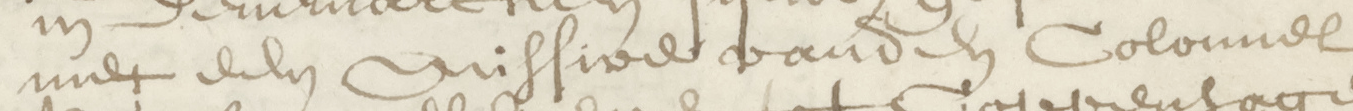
met een Missive vanden Colonnel
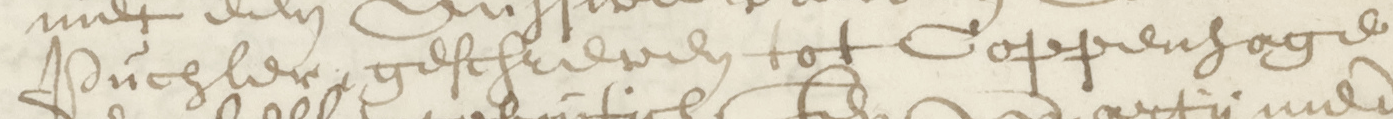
Puchler, geschreven tot Coppenhage
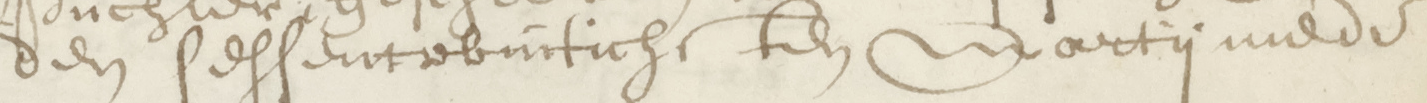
den sessentwintichsten Martij mede
